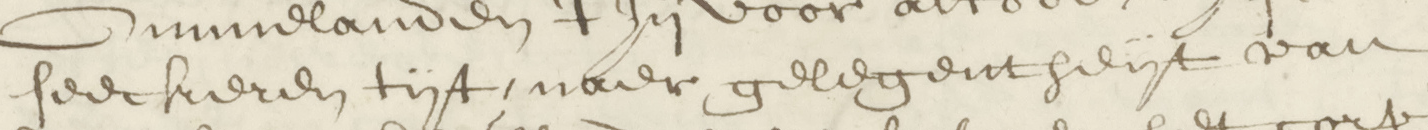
seeckeren tijt, naer gelegentheijt van
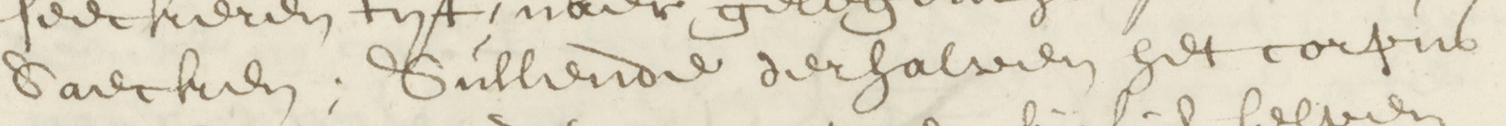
Saecken; Sullende derhalven het corpus
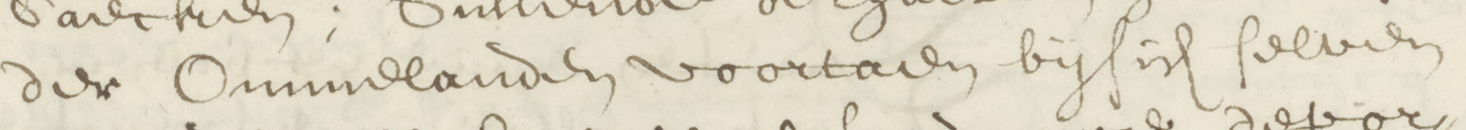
der Ommelanden voortaen bij sich selven
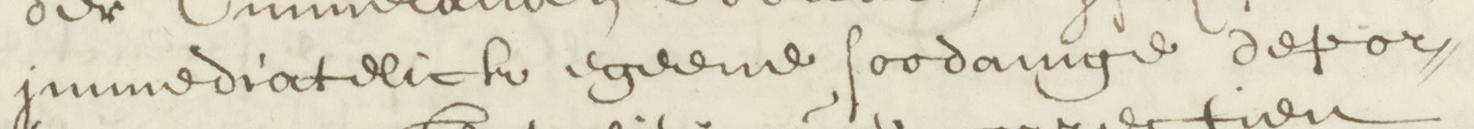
immediatelick egeene soodanige depor„
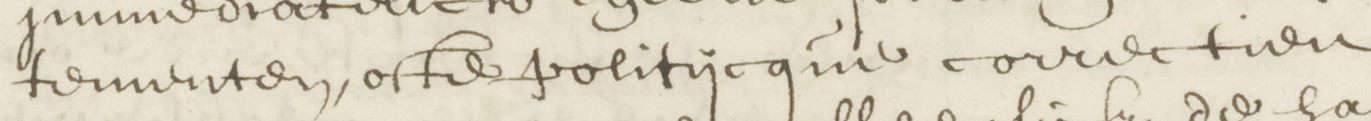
tementen, ofte politijcque correctien
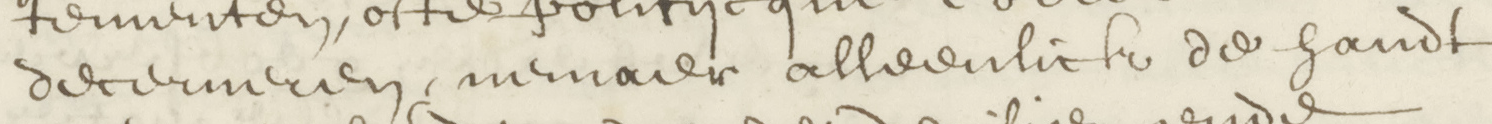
decerneren, nemaer alleenlick de handt
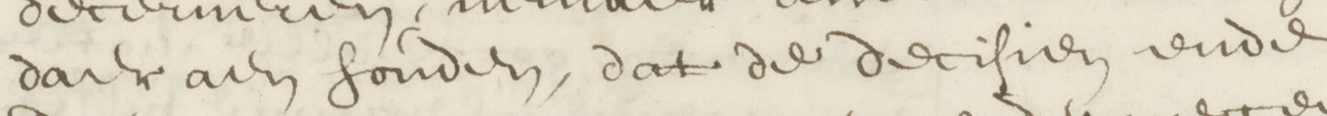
daer aen houden, dat de decisien ende
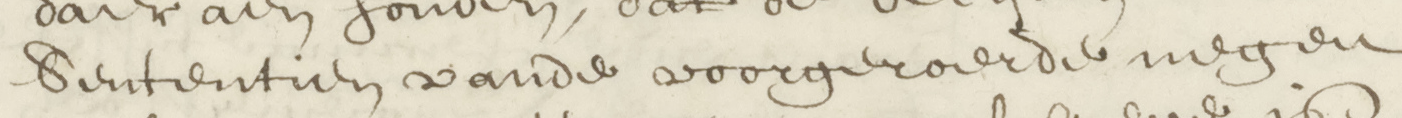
Sententien vande voorgeroerde negen
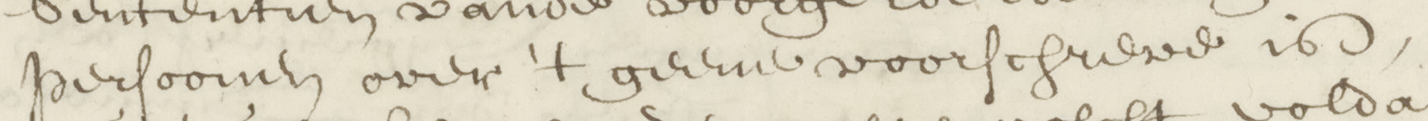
persoonen over ‛t geene voorschreve is,
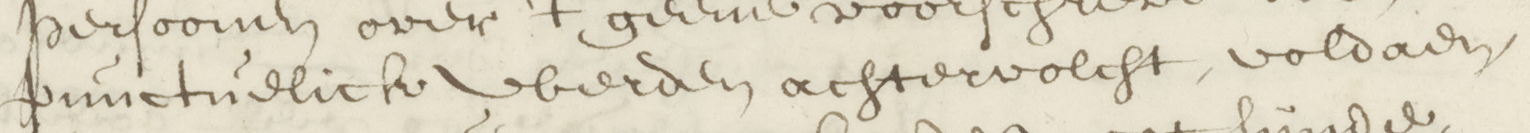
punctuelick werden achtervolcht, voldaen,
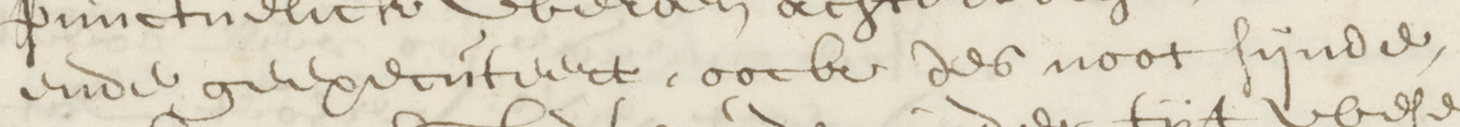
ende geexecuteert, oock des noot sijnde,
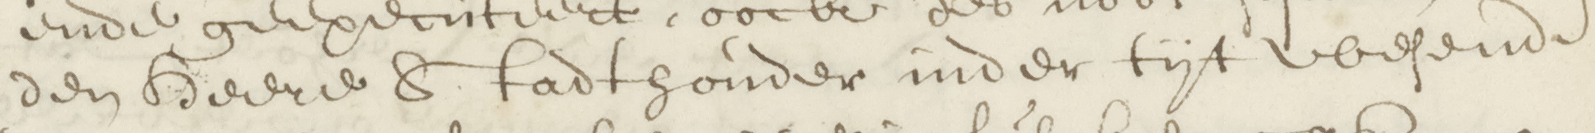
den Heere Stadthouder inder tijt wesende
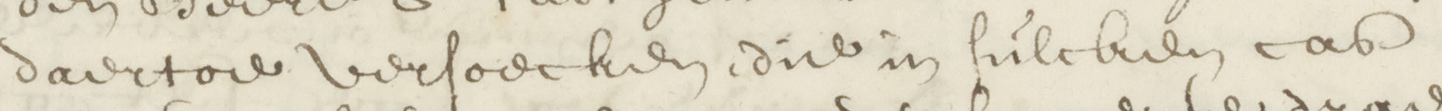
daertoe versoecken, die in sulcken cas
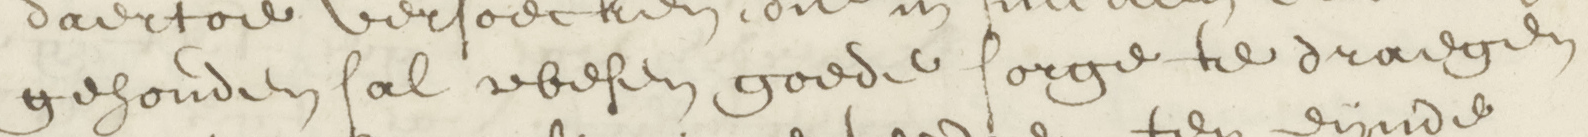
gehouden sal wesen goede sorge te draegen
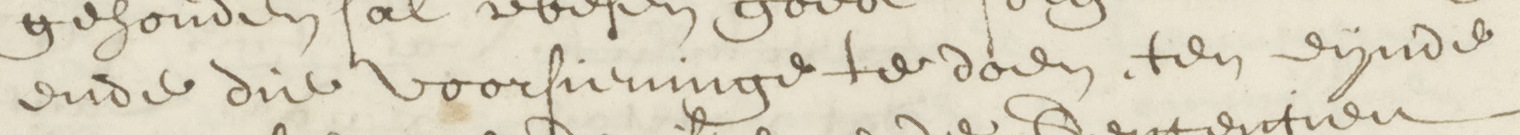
ende die voorsieninge te doen, ten eijnde
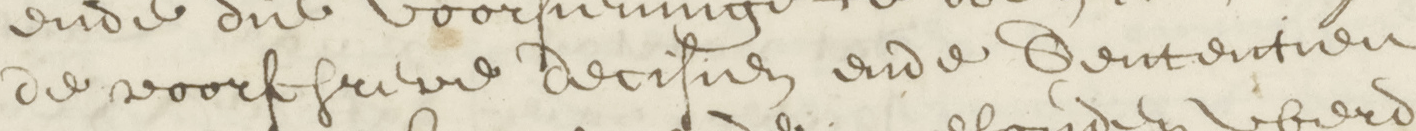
de voorschreve decisien ende Sententien
